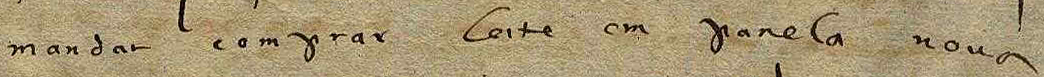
mandar comprar leite em panela noua
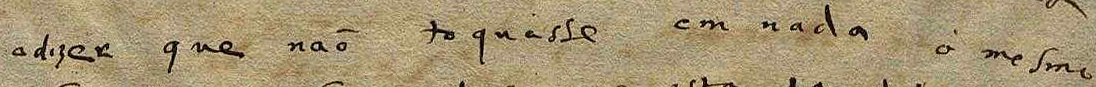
a dizer que naõ toquasse em nada o mesmo
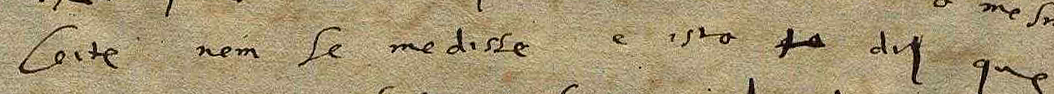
leite nem se medisse e isto se diz que
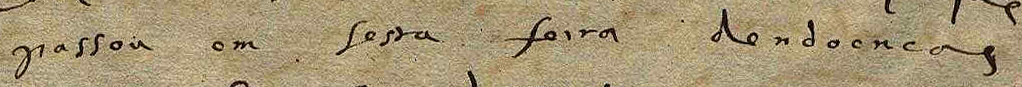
passou em sesta feira dendoencas
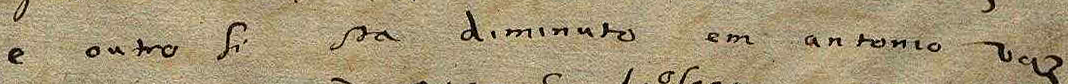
e outrosi sta diminuto em antonio vaz
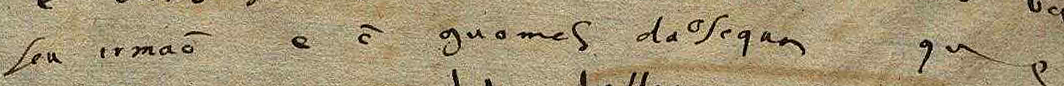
seu irmaõ e ē guomes daosequa que
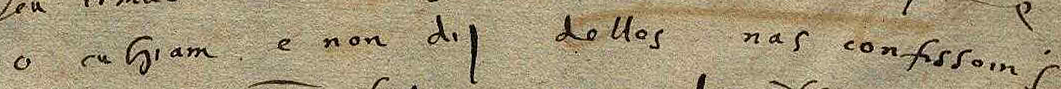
o cubriam e non diz delles nas confissoins
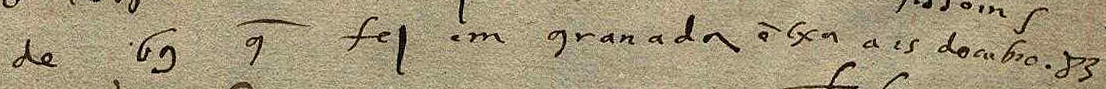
de 69 q̄ fez em granada ē lxa a 15 dotubro. 83
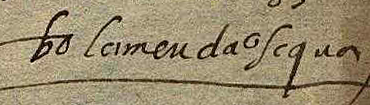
b̄tolameu daosequa
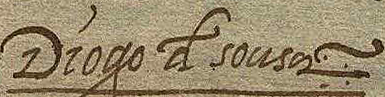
Diogo d̄ sousa
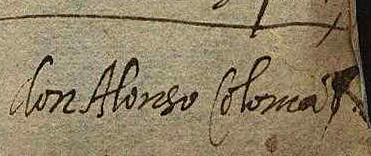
don Alonso Coloma
